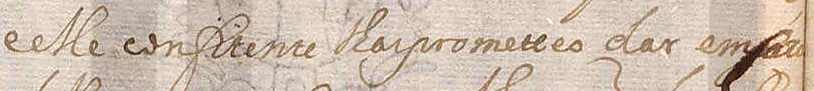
e elle confitente lhas prometteo dar em Caza
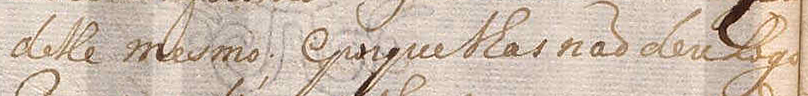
delle mesmo; e porque lhas naõ deu logo
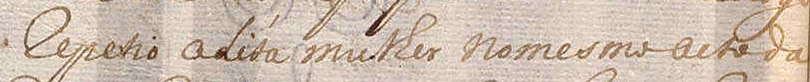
Repetio a dita mulher no mesmo acto da
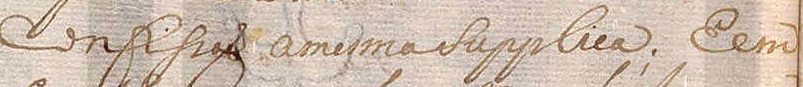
confissaõ a mesma supplica; E em
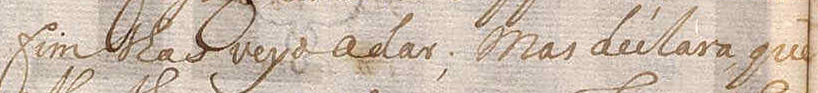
fim lhas veyo a dar; mas declara, que
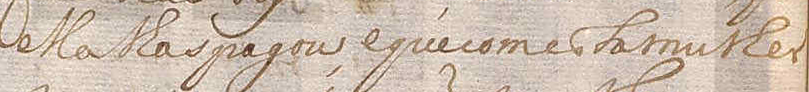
ella lhas pagou, e que com esta mulher
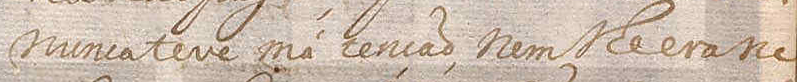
nunca teue má tençaõ, nem lhe era ne
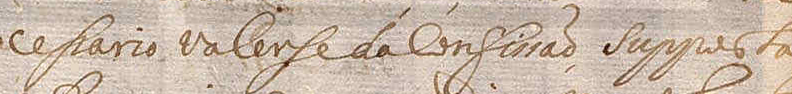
cessario valerse da Confissaõ, supposta
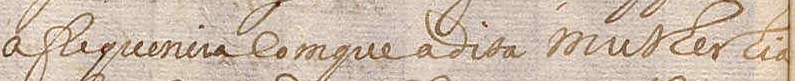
a frequencia com que a dita mulher hia
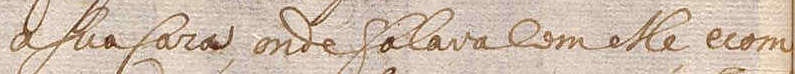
a sua Caza, onde falava com elle e com
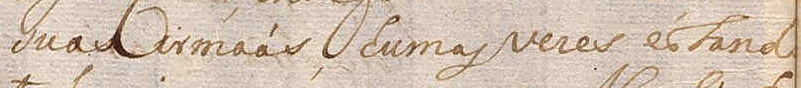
suas irmaãs, humas vezes estando
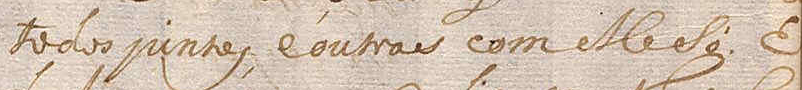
todos juntos, e outras com elle só. E
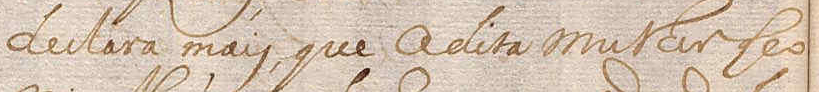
declara mais, que a dita mulher Leo
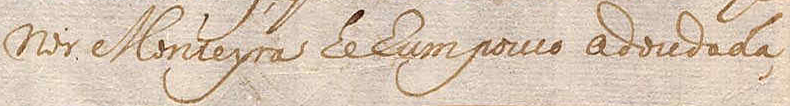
nor Monteyra he hum pouco adoudada, e
